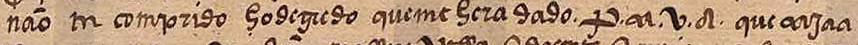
não ter comprido ho degredo que me hera dado. P. a .v. A. que ajaa
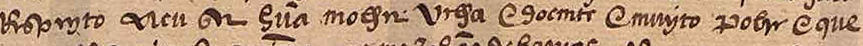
Respeyto a eu ser hūa molher Velha e doemte e muyto pobre e que
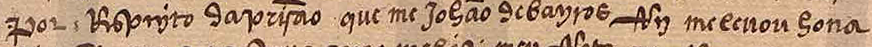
por Respeyto da prisão que me Johão de bayros ffez me leuou ho na
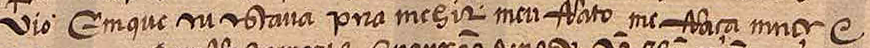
Vio Em que eu estaua pera me hir meu ffato me ffaça merce e
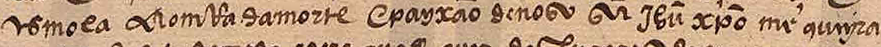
esmola a omRa da morte e payxão de noso sōr Jhū xp̄o me queyra
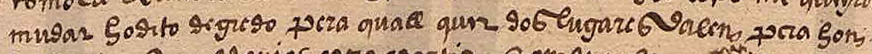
mudar ho dito degredo pera quallquer dos lugares dalem pera hom
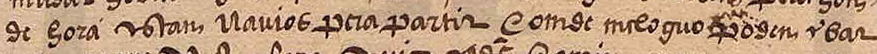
de hora estam Nauios pera partir e omde me loguo podem ēbar
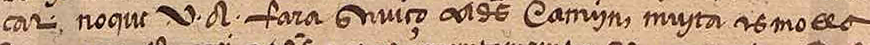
car no que .V. A. fara seruiço a ds̄ e a mym mujta esmolla
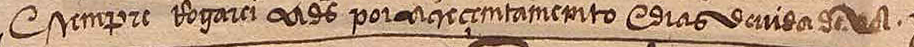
e ssempre Rogarei a ds̄ por acrecemtamemto e dias de uida de v A.
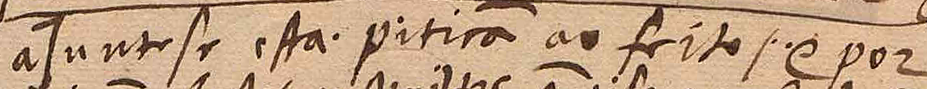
aJunte se esta pitiçā ao feito /. e por
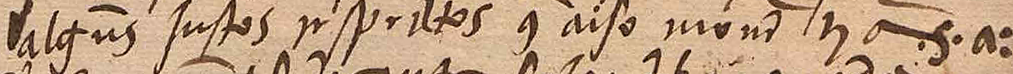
algūs Justos respeitos q̄ a iso mouē ha .s. a.
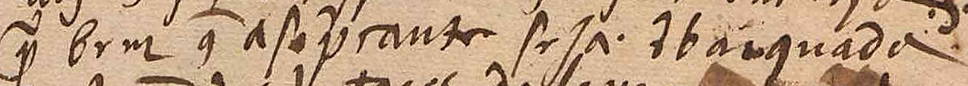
p̄o bem q̄ a sop̄cante seJa ēbarquada
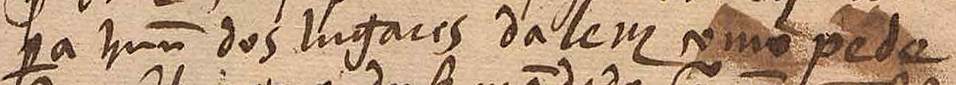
ꝑa huū dos lugares dalem como pede
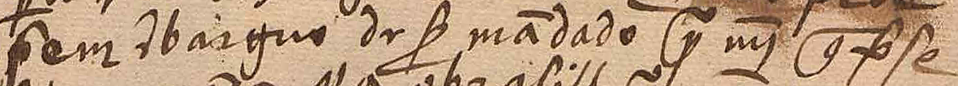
sem ēbarguo de ꞩ mādado p̄o mj̄ q̄ fose
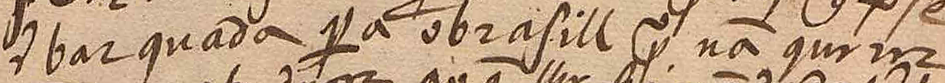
ēbarquada ꝑa o brasill p̄o nā querer
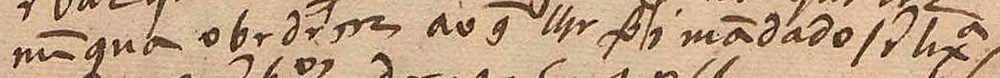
nūqua obedecer ao q̄ lhe foi mādado / ē lixa /
